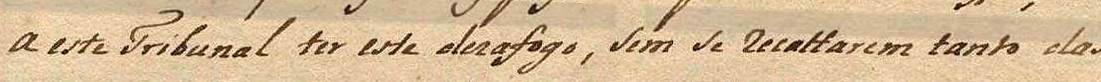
a este Tribunal ter este dezafogo, sem se Recattarem tanto das
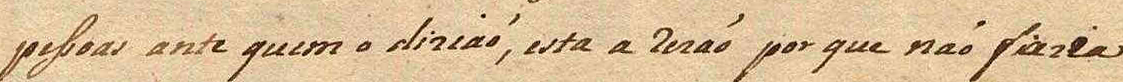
pessoas ante quem o diziaõ, esta a Rezaõ por que naõ fazia
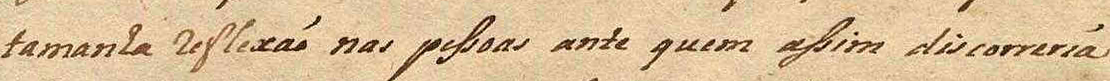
tamanha Reflexaõ nas pessoas ante quem assim discorreria.
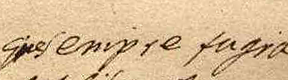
Que sempre fugia
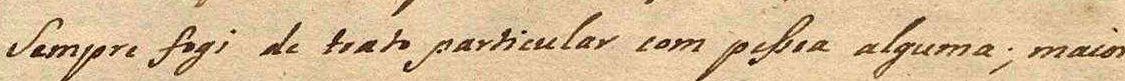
Sempre fogi de trato particular com pessoa alguma; maior
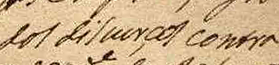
dos discurços contra
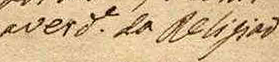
a verd.e da Religiaõ
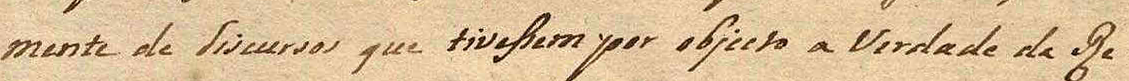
mente de discursos que tivessem por objecto a Verdade da Re
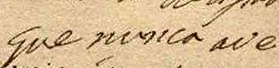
que nunca ave
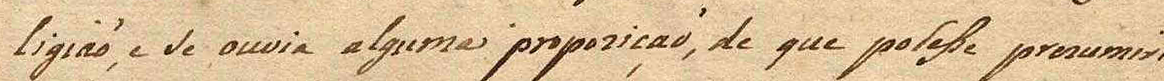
Ligiaõ, e se ouvia alguma propoziçaõ, de que podesse prezumir
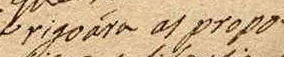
rigoára as propo
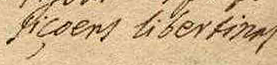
siçoens libertinas.
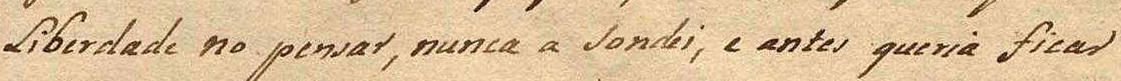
Liberdade no pensar, nunca a sondei, e antes queria ficar
